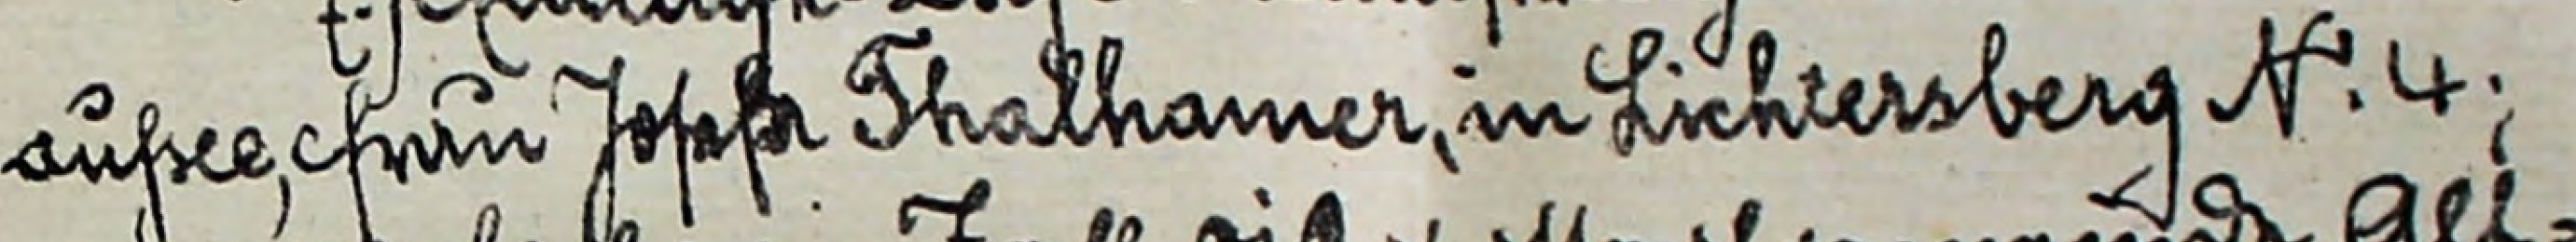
aussee, Frau Josefa Thalhamer, in Lichtersberg No 4;
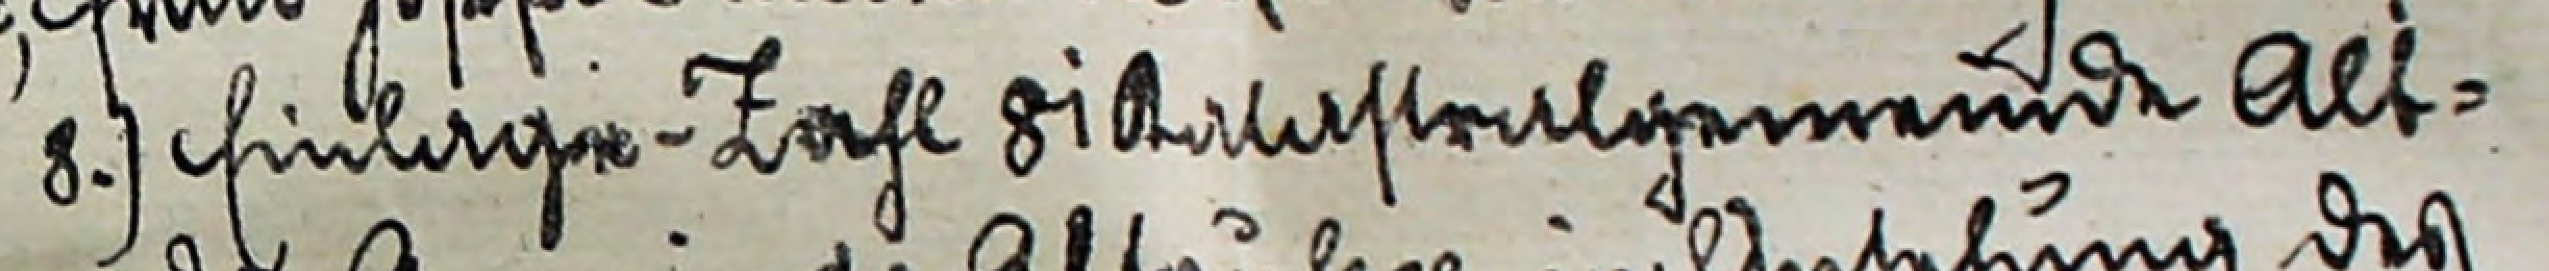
8.) Einlage - Zahl 81 Katastralgemeinde Alt=
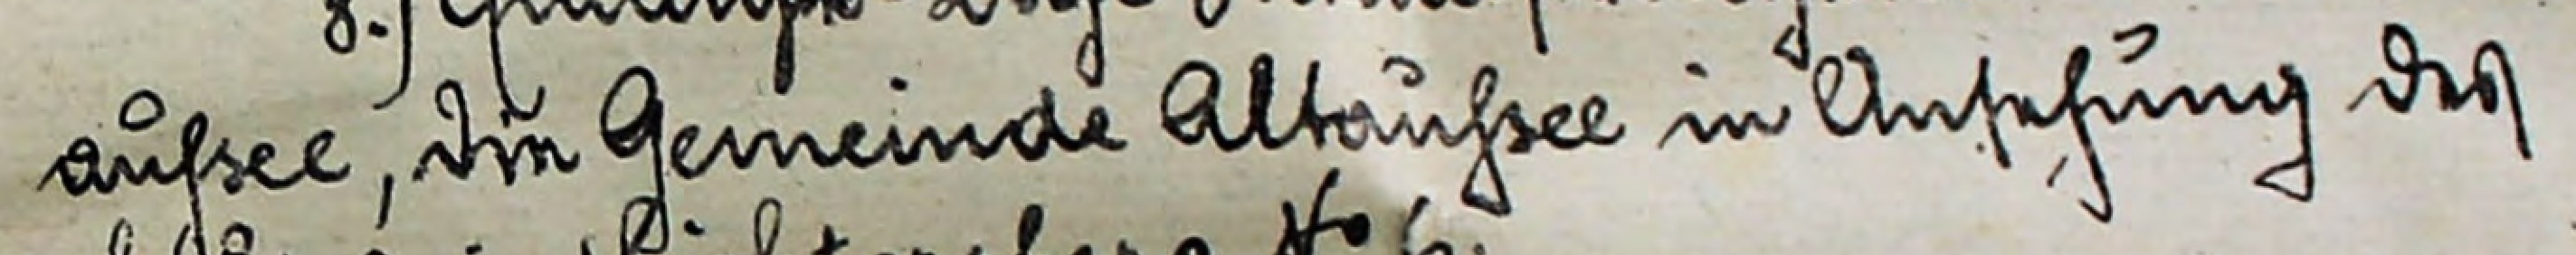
aussee, die Gemeinde Altaussee in Ansehung des
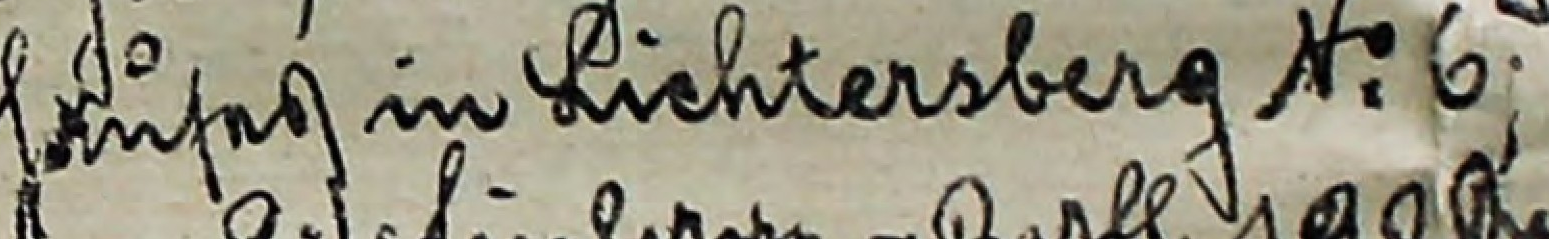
Hauses in Lichtersberg No 6;
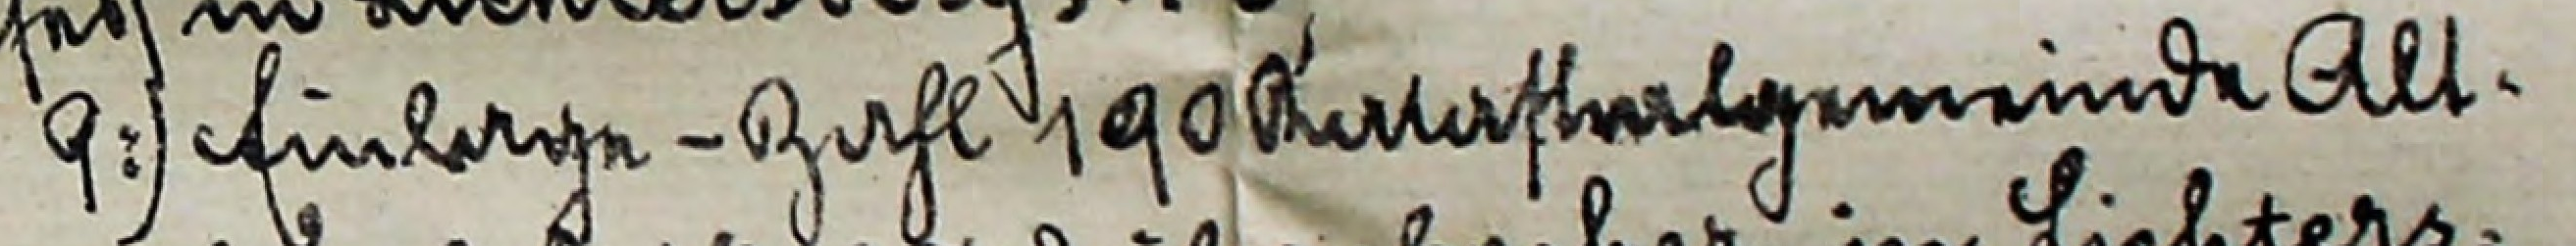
9.) Einlage - Zahl 190 Katastralgemeinde Alt=
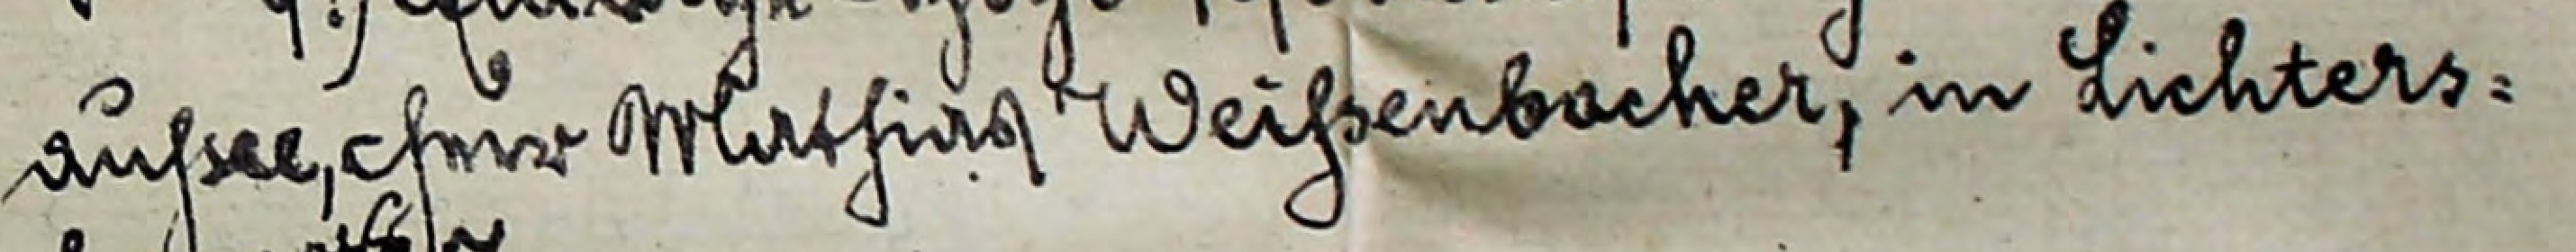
aussee, Herr Mathias Weissenbacher, in Lichters=
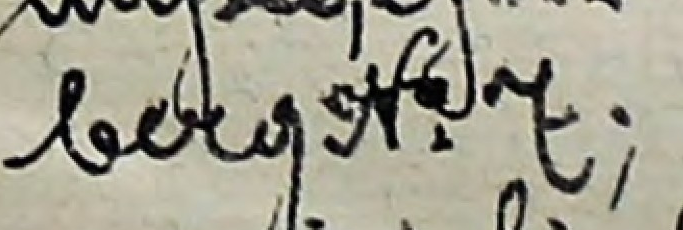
berg No 7;
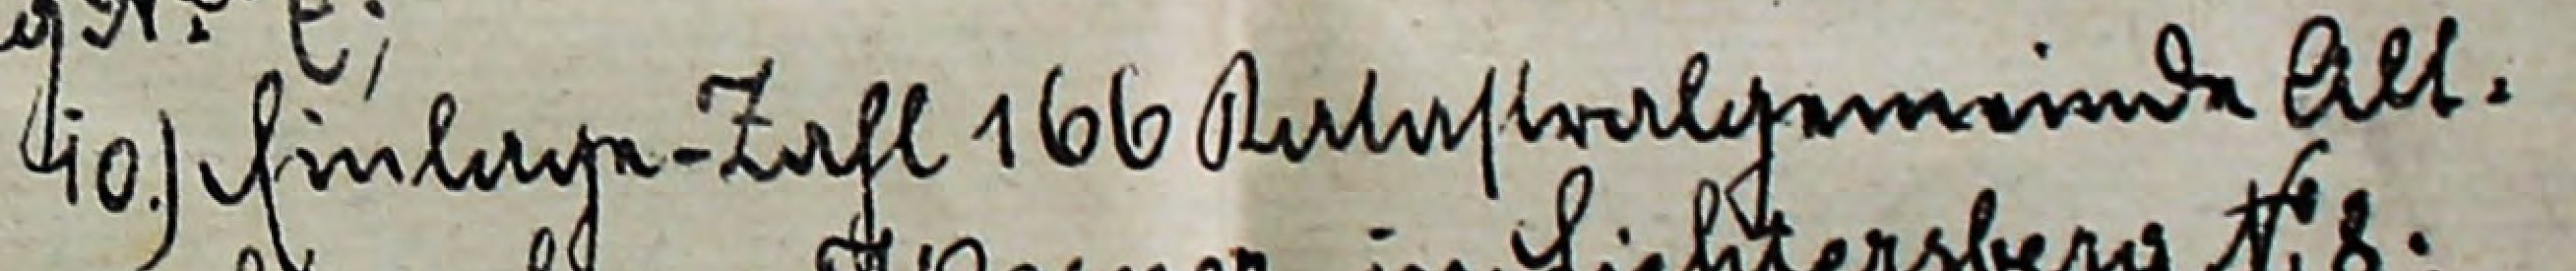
10.) Einlage - Zahl 166 Katastralgemeinde Alt=
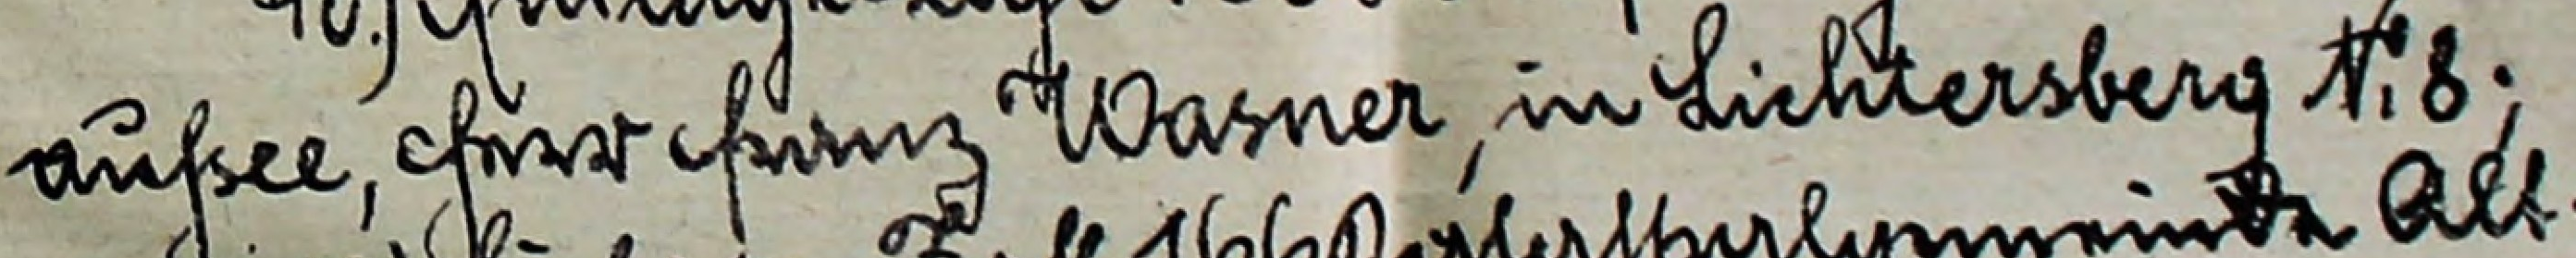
aussee, Herr Franz Wasner, in Lichtersberg No 8;
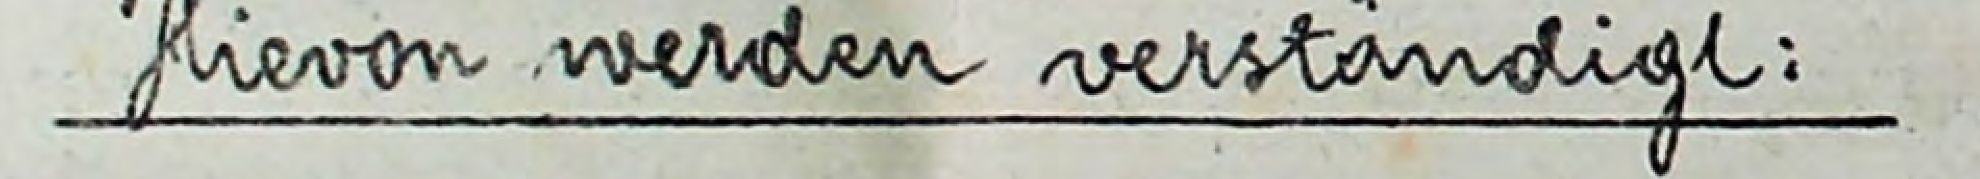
Hievon werden verständigl:
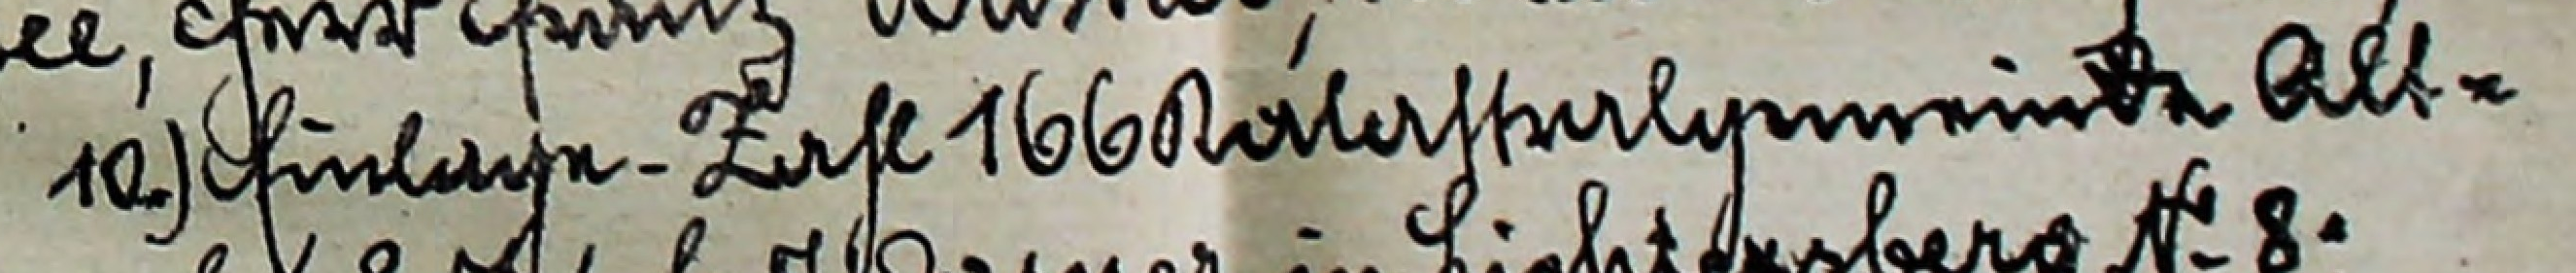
10.) Einlage - Zahl 166 Katastralgemeinde Alt=
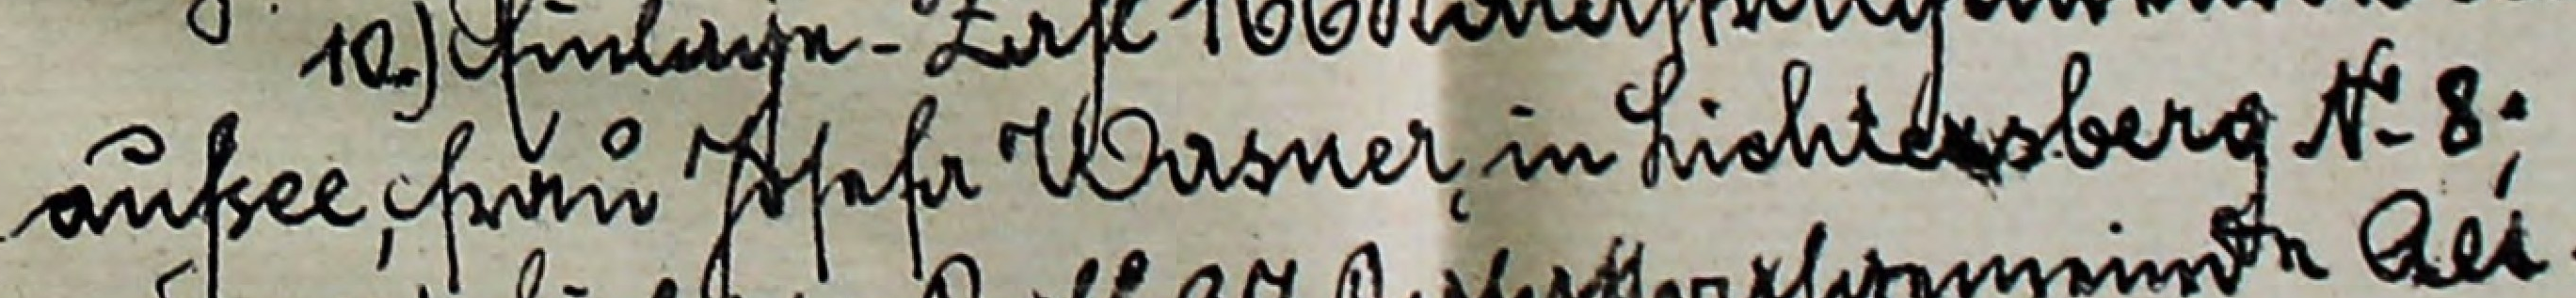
aussee, Frau Josefa Wasner, in Lichtersberg No 8;
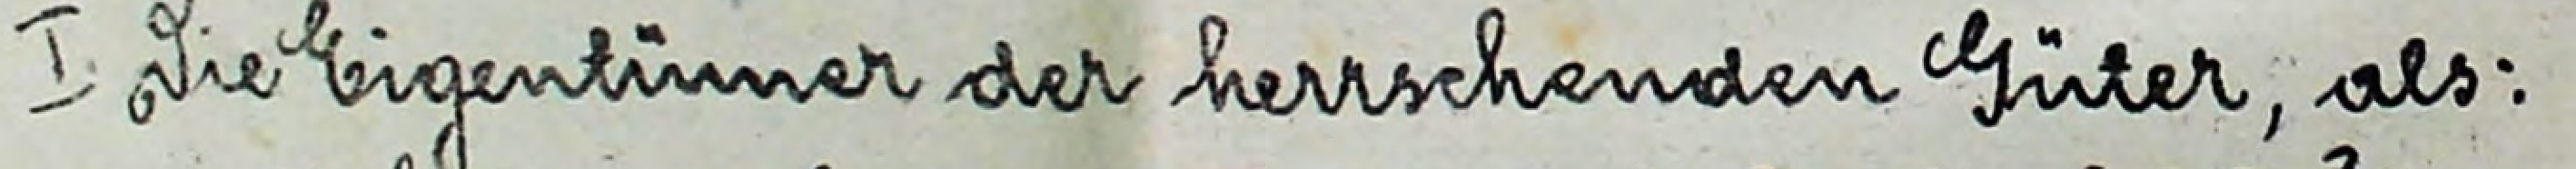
I. Die Eigentümer der herrschenden Güter, als:
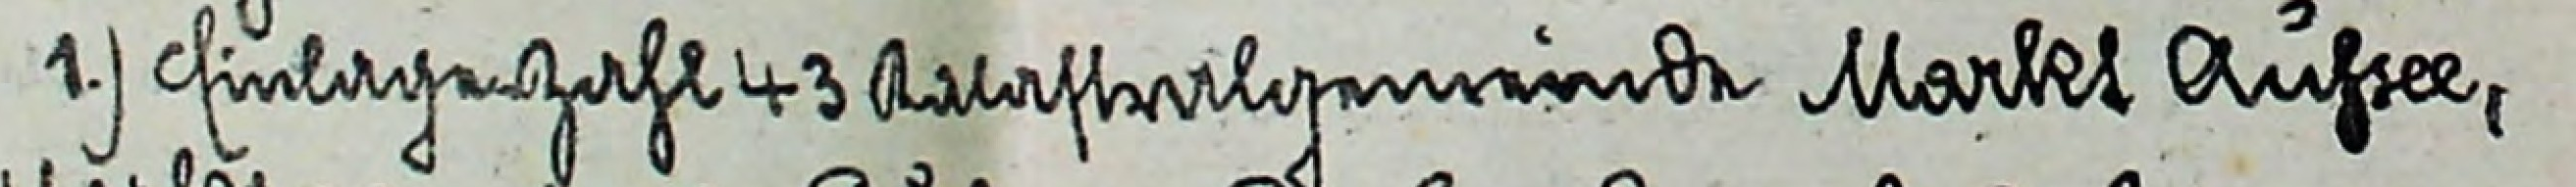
1.) Einlagen-Zahl 43 Katastralgemeinde Markt Aussee,
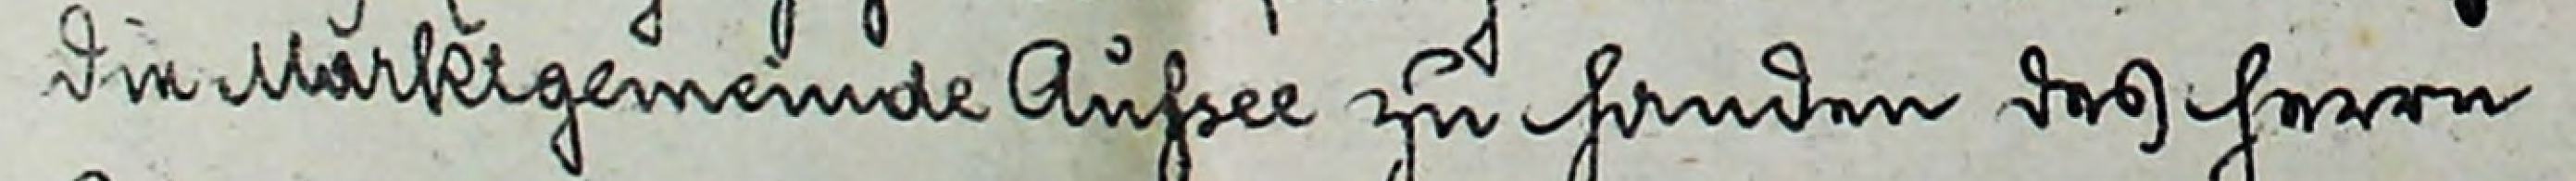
Die Marktgemeinde Aussee zu Handen des Herrn
